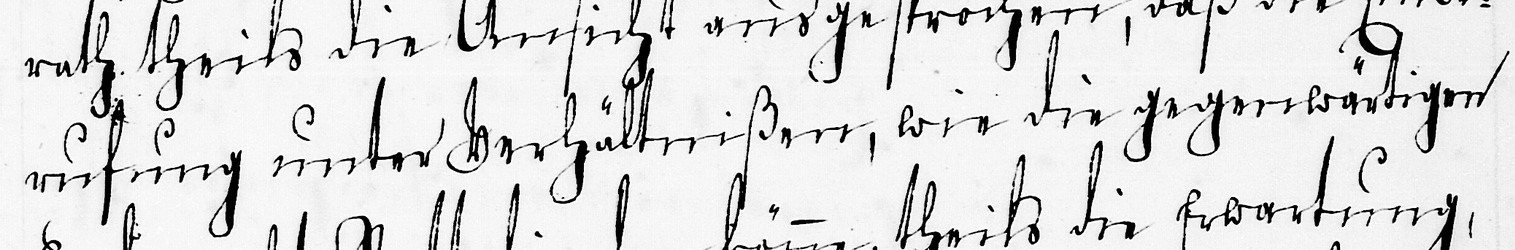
rufung unter Verhältnißen, wie die gegenwärtigen
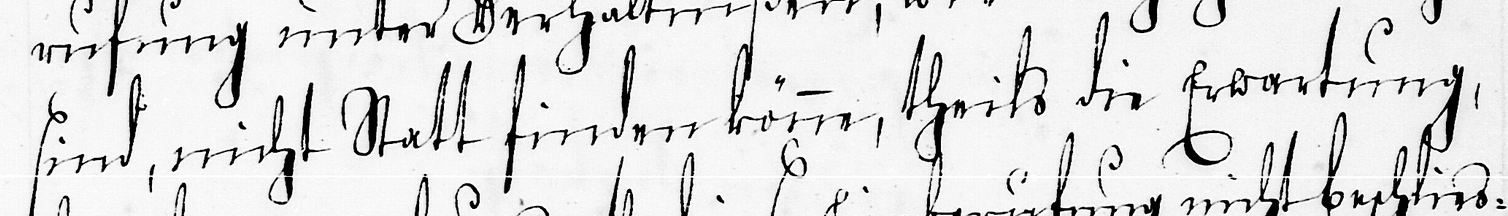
sind, nicht Statt finden könne, theils die Erwartung,
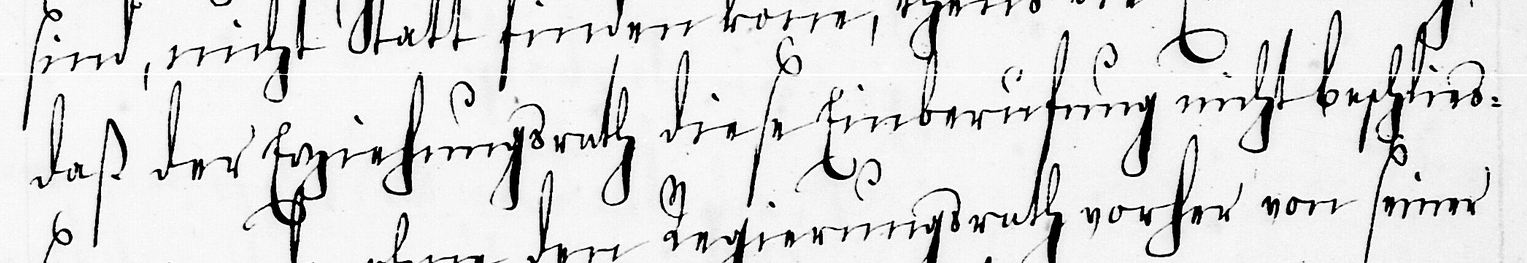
daß der Erziehungsrath diese Einberufung nicht beschli¬
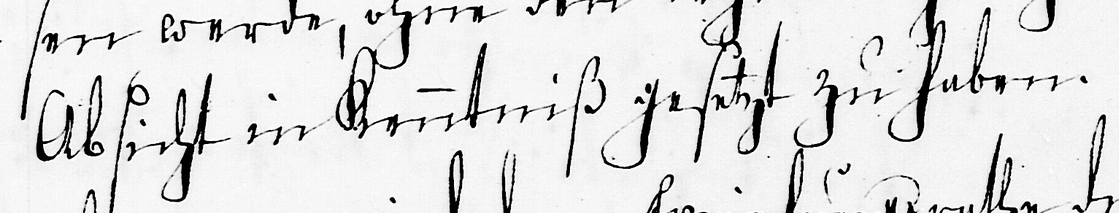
Absicht in Kenntniß gesetzt zu haben.
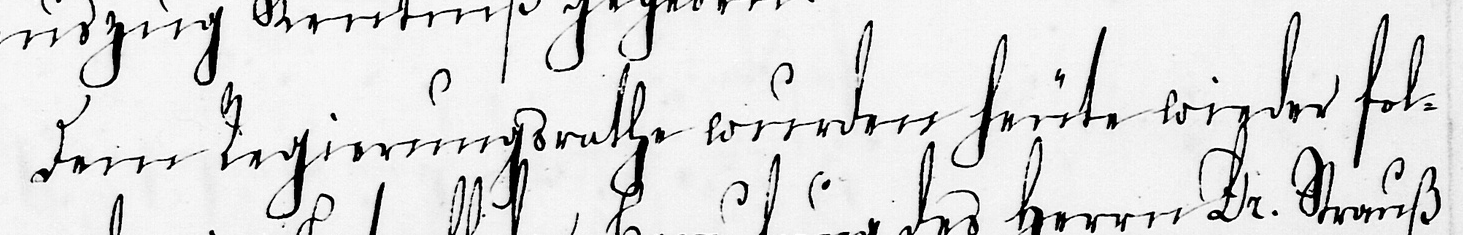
Dem Regierungsrathe wurden heute wieder fol¬
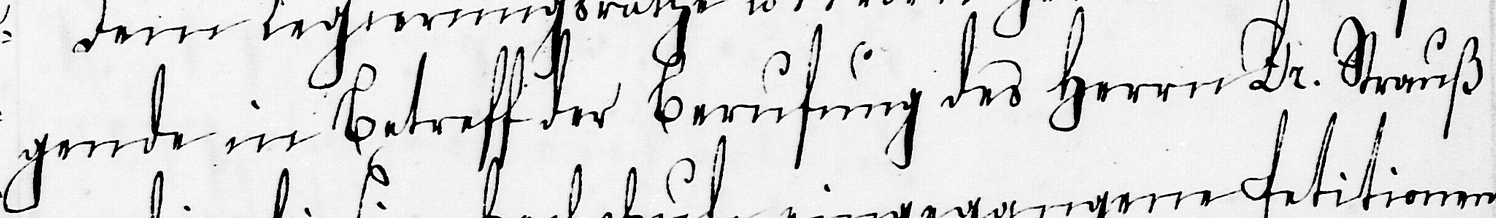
gende in Betreff der Berufung des Herrn Dr. Strauß
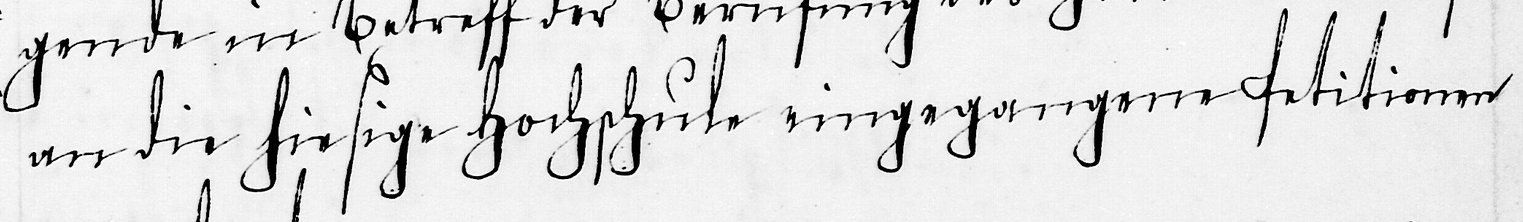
an die hiesige Hochschule eingegangene Petitionen
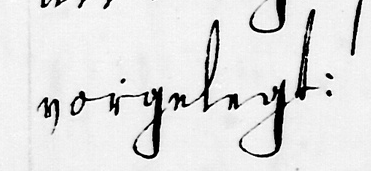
vorgelegt:
